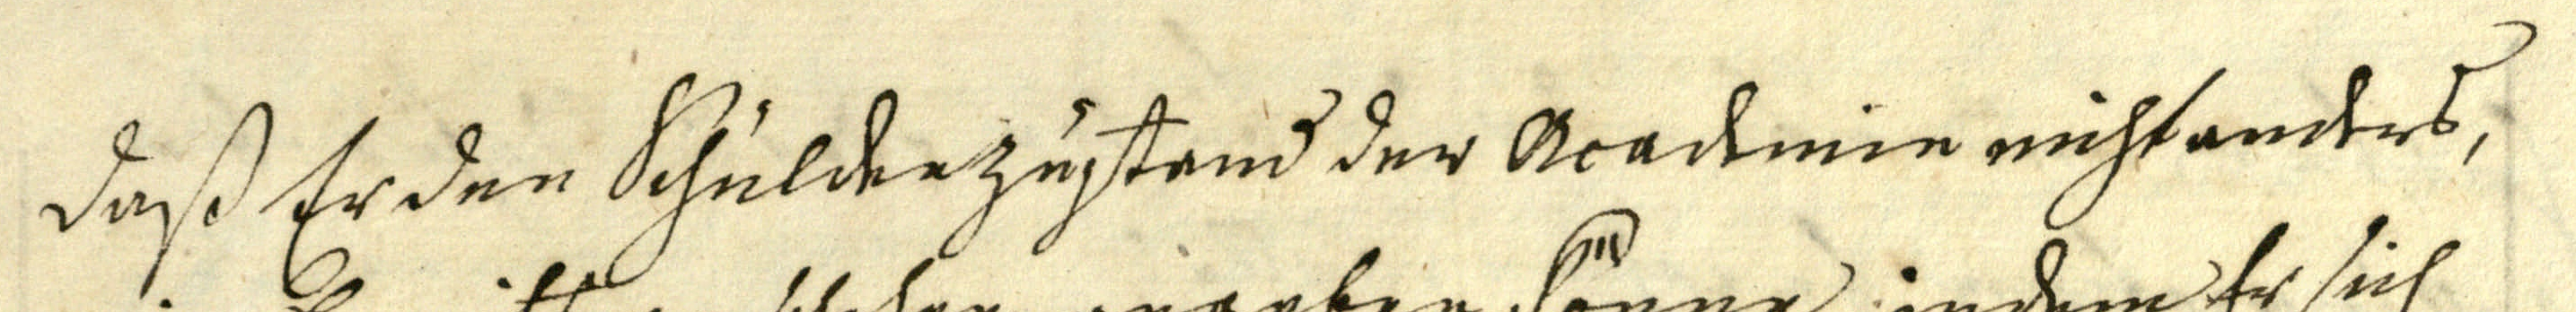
daß Er den Schuldenzustand der Academie nicht anders,
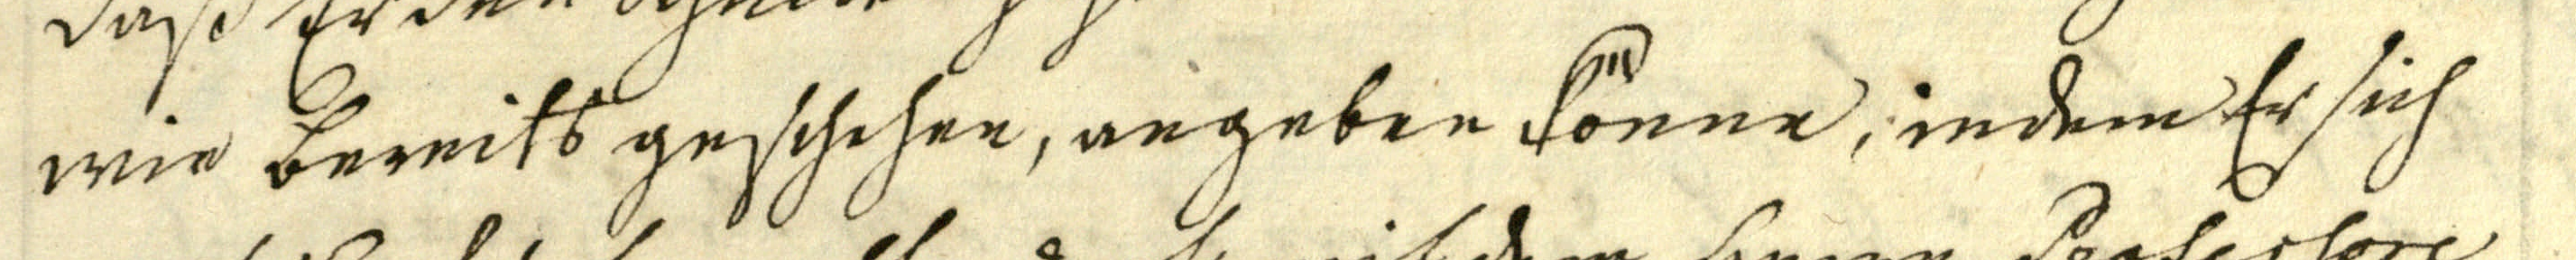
wie bereits geschehen, angeben könne, indem Er sich
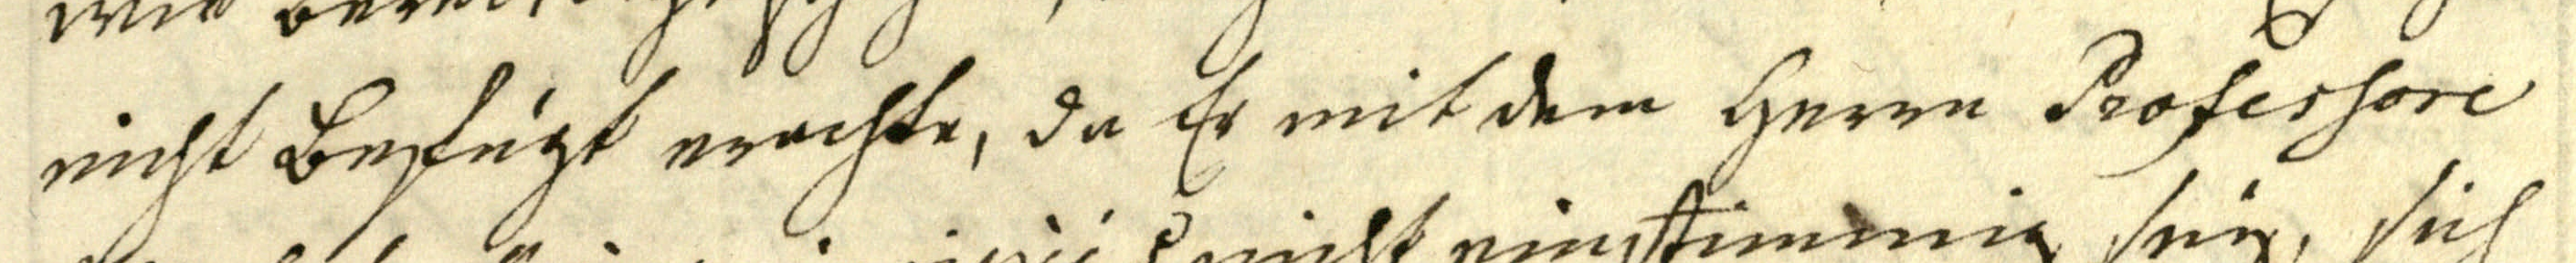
nicht befugt erachte, da Er mit dem Herrn Professore
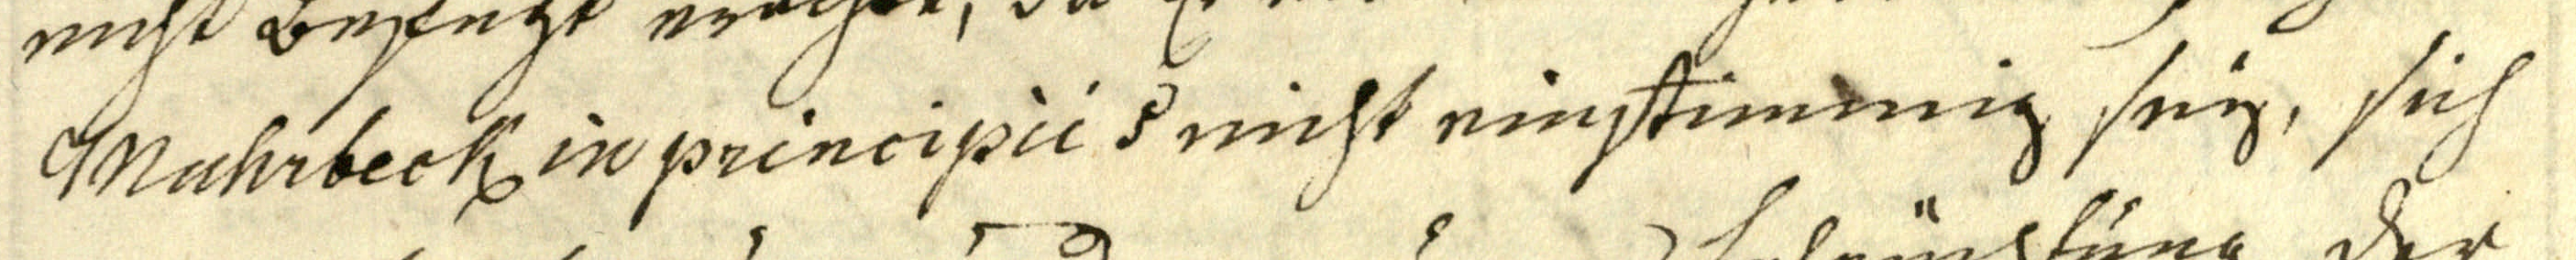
Muhrbeck in principiis nicht einstimmig seÿ, sich
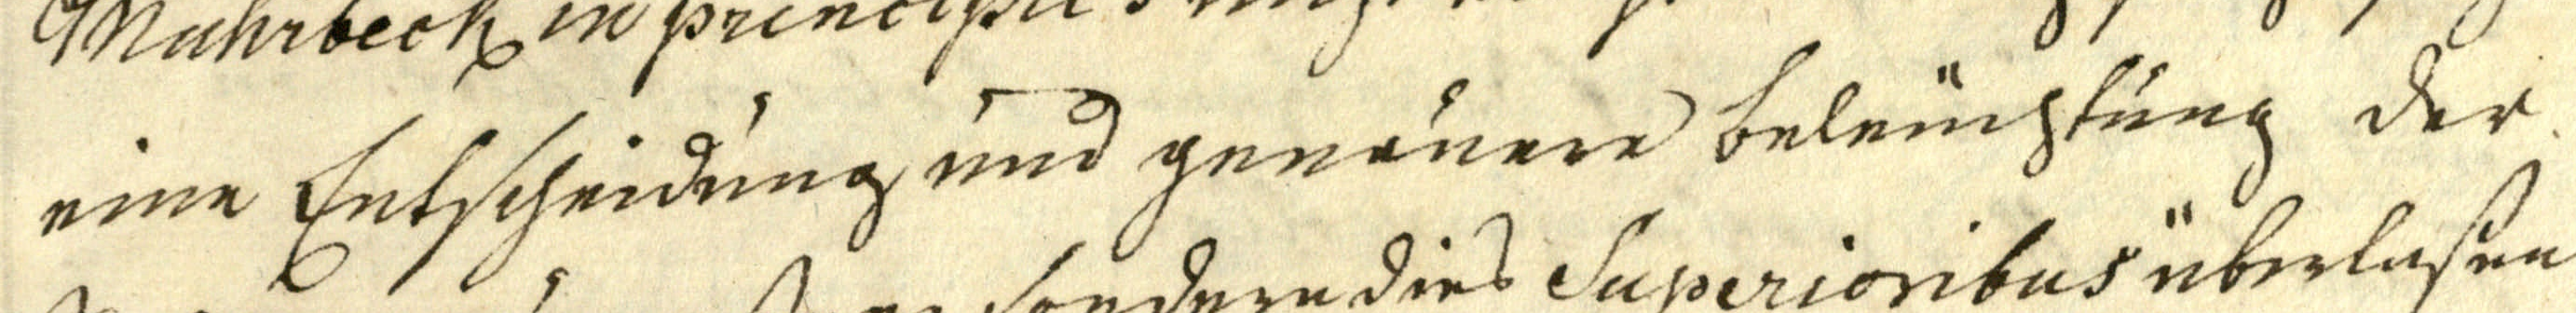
eine Entscheidung und genauere Beleuchtung der
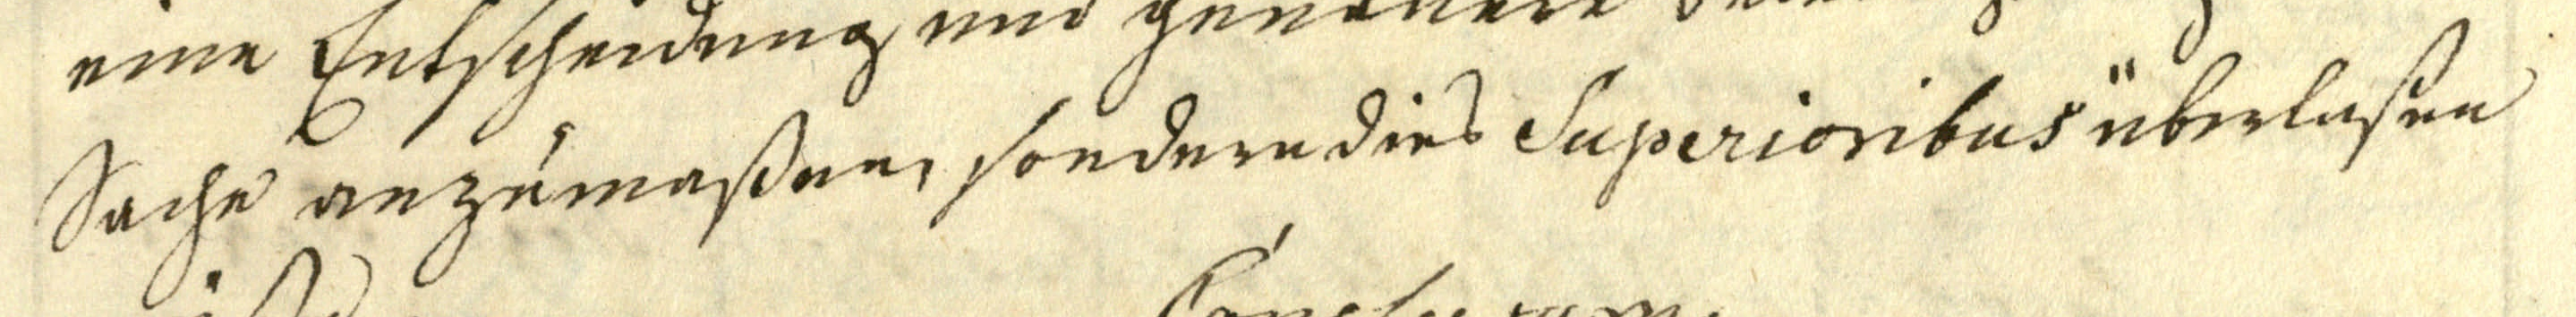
Sache anzumaßen, sondern dies Superioribus überlaßen
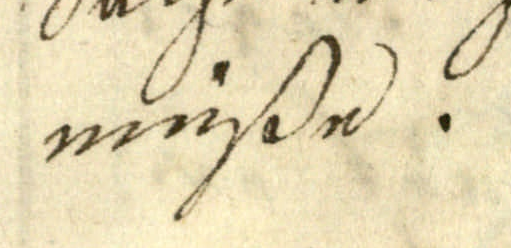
müße.
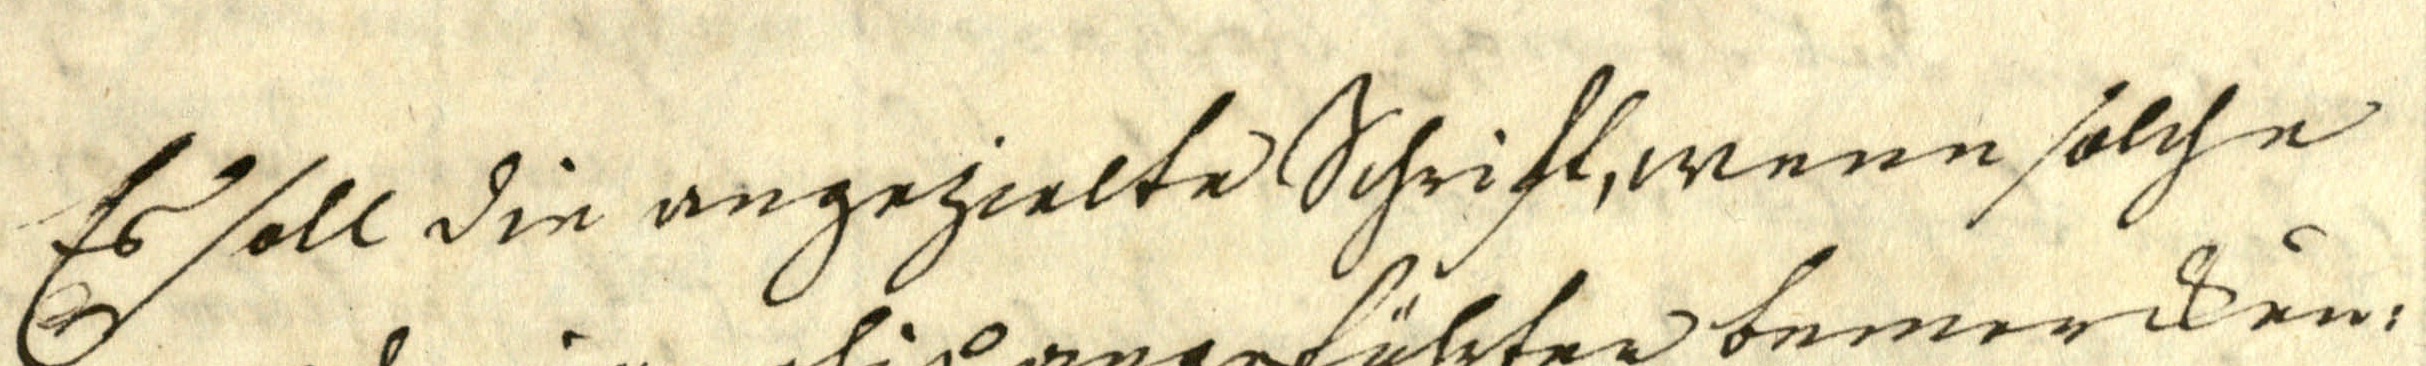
Es soll die angezielte Schrift, wenn solche
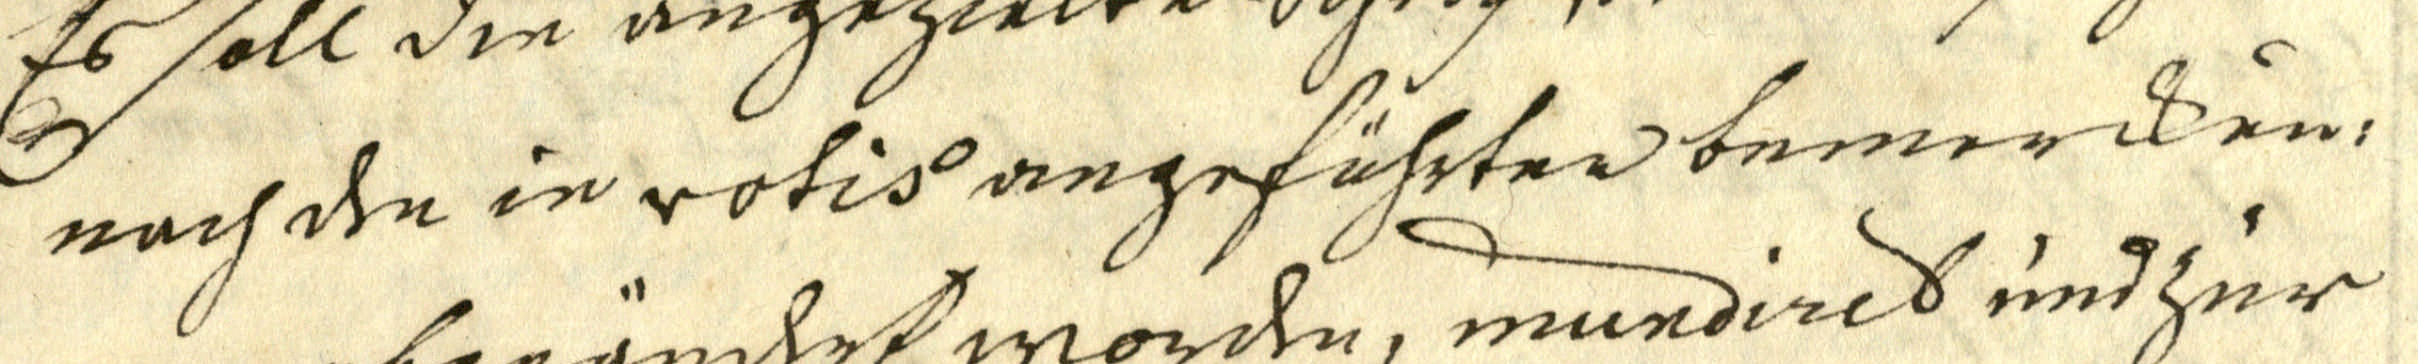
nach den in votis angeführten Bemerckun¬
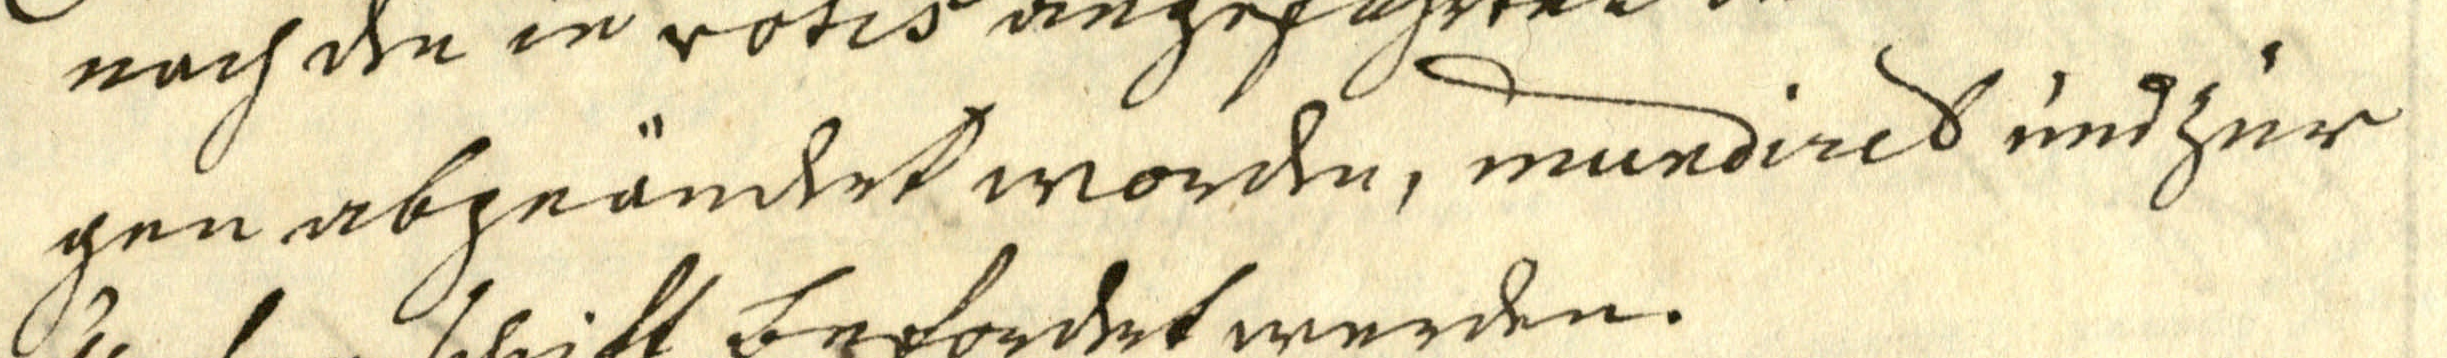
gen abgeändert worden, mundiret und zur
